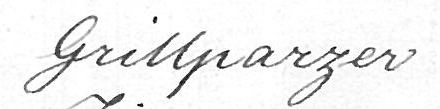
Grillparzer
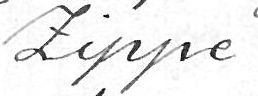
Zippe
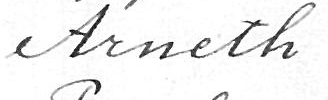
Arneth
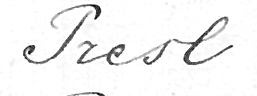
Presl
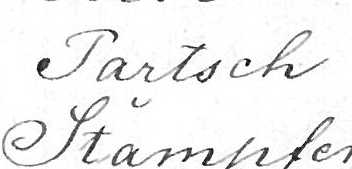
Partsch
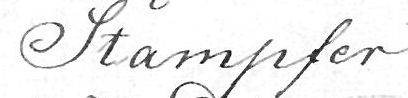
Stampfer
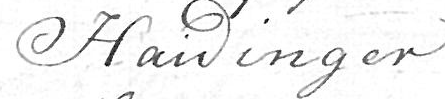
Haidinger
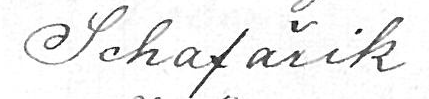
Schafarik
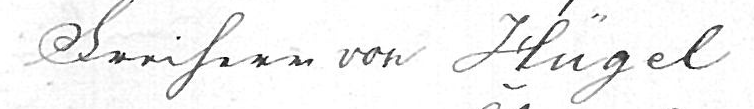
Freiherr von Hügel
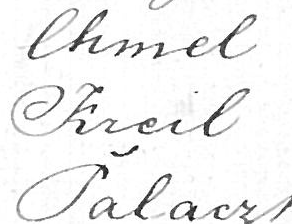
Chmel
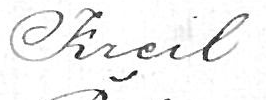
Kreil
